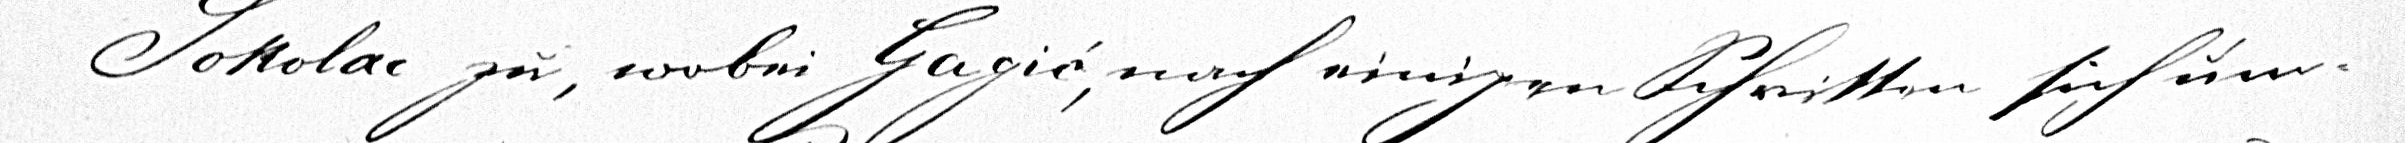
Sokolac zu, wobei Hagić, nach einigen Schritten sich um¬
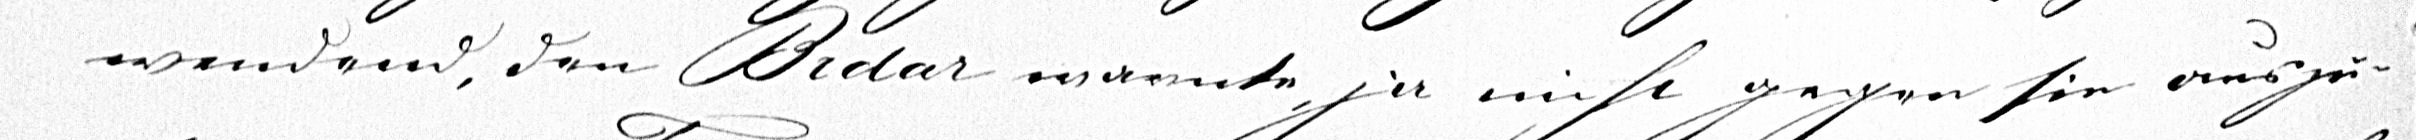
wendend, den Brdar warnte, ja nicht gegen sie auszu¬
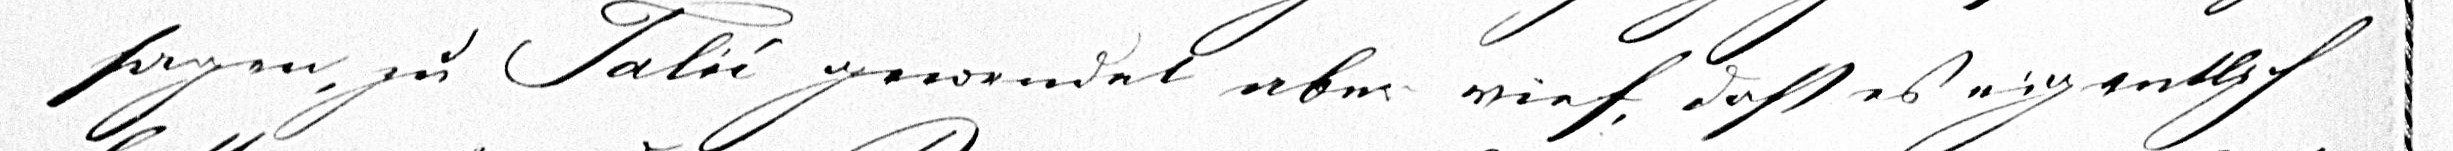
sagen, zu Talić gewendet aber vieh, daß es eigentlich
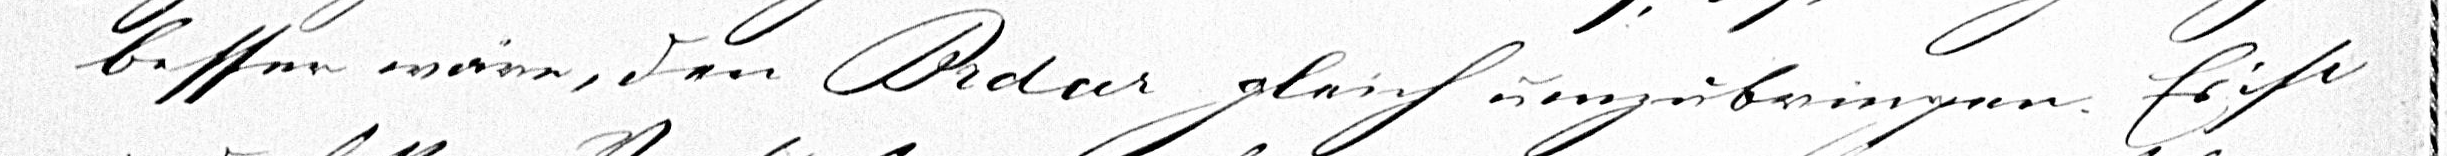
besser meine, den Brdar gleich umzubringen. Es ist
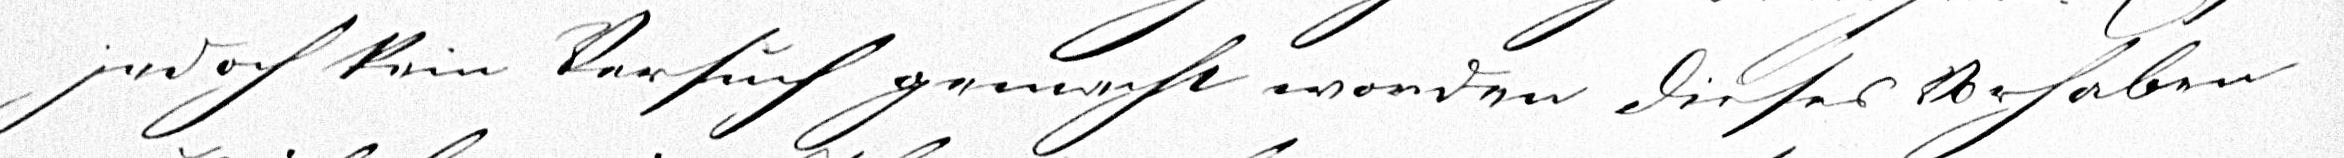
jedoch kein Versuch gewacht worden dieses Vorhaben
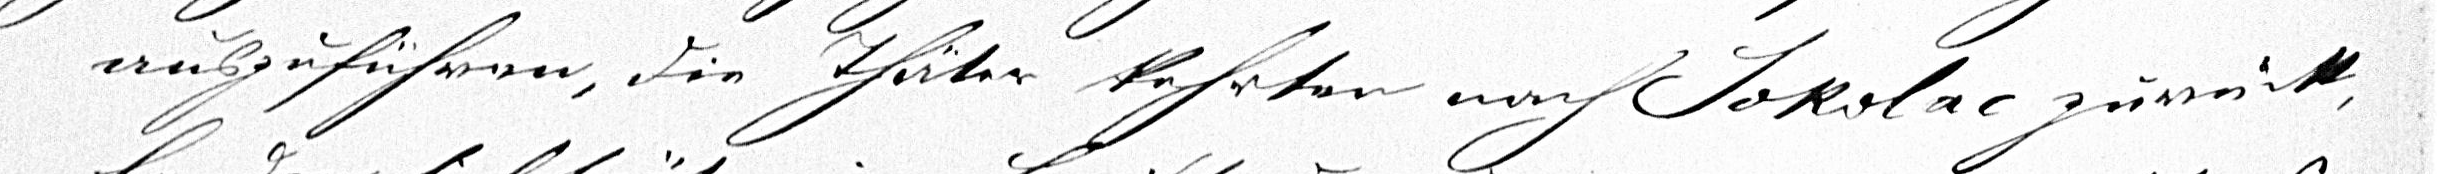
auszuführen, die Thäter kehrten nach Sokolac zurück,
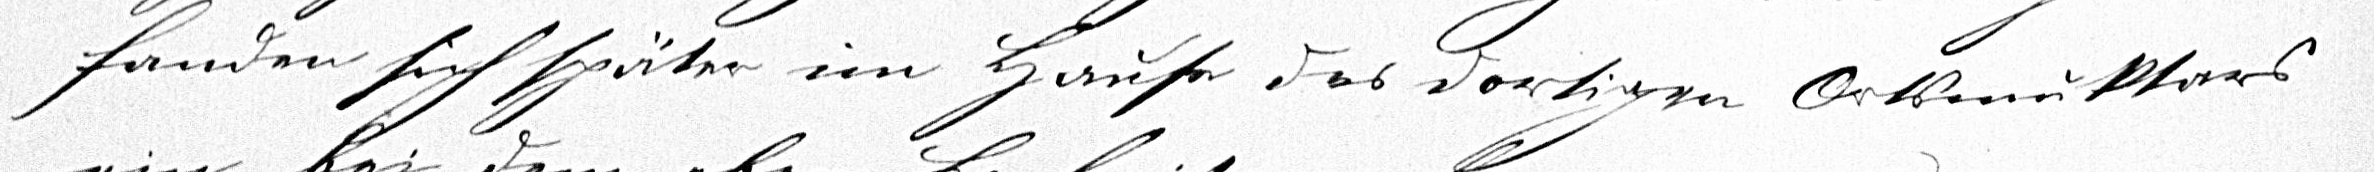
fanden sich später im Hause des dortigen Ortmuktars
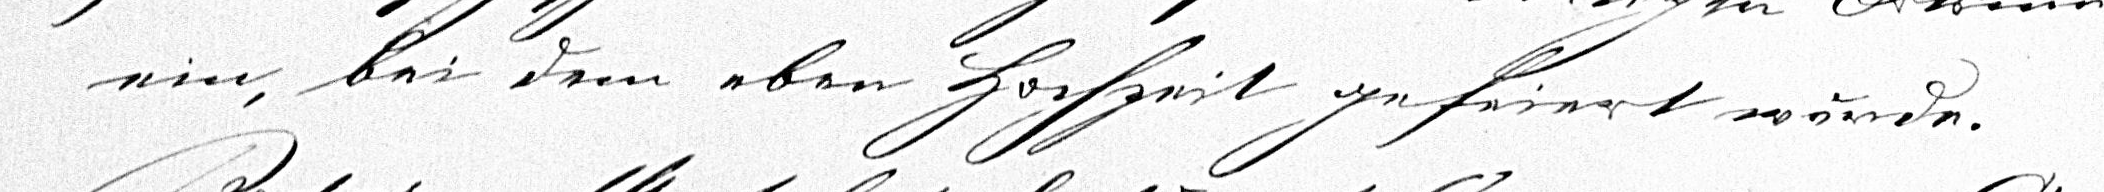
ein, bei dem eben Hochzeit gefeiert wurde.
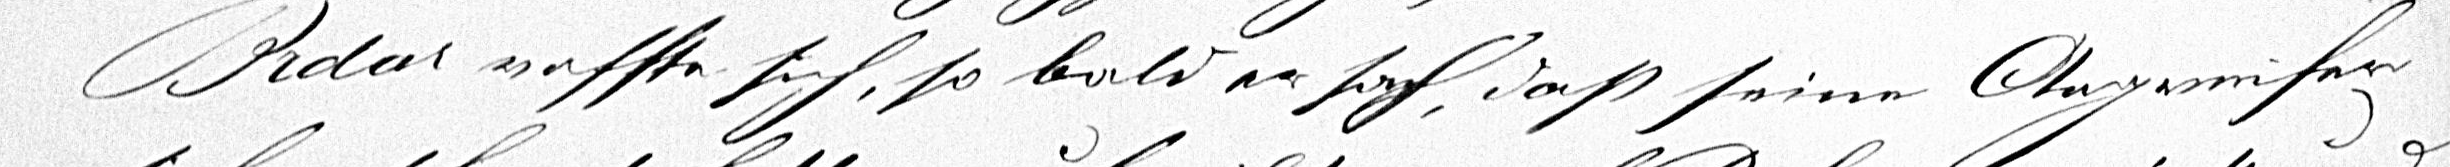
Brdar vaxxte sich, so bald er sah, daß seine Angreifer
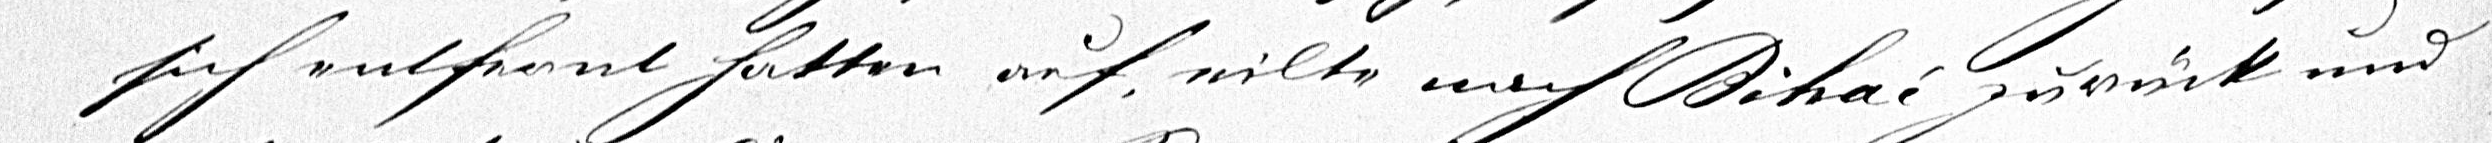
sich entfernt hatten auf, eilte nach Bihać zurück und
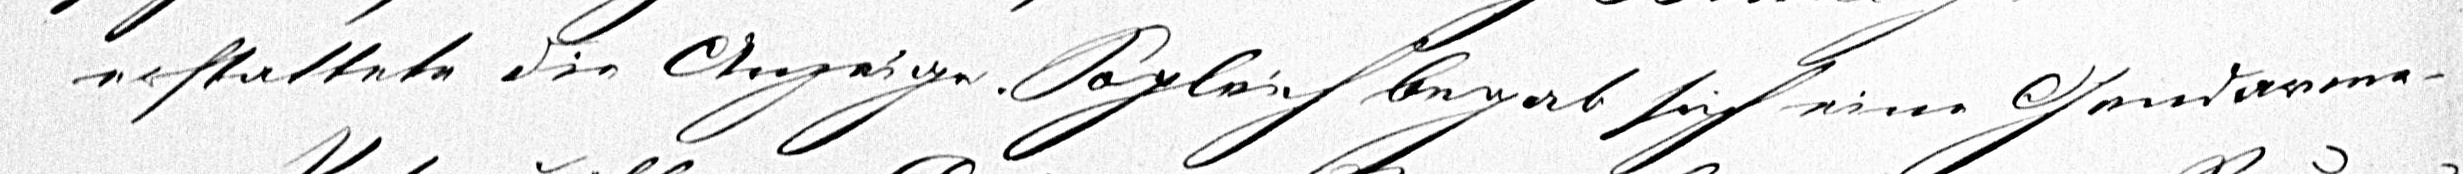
erstattete die Anzeige. Pogleich begab sich eine Gendarme¬
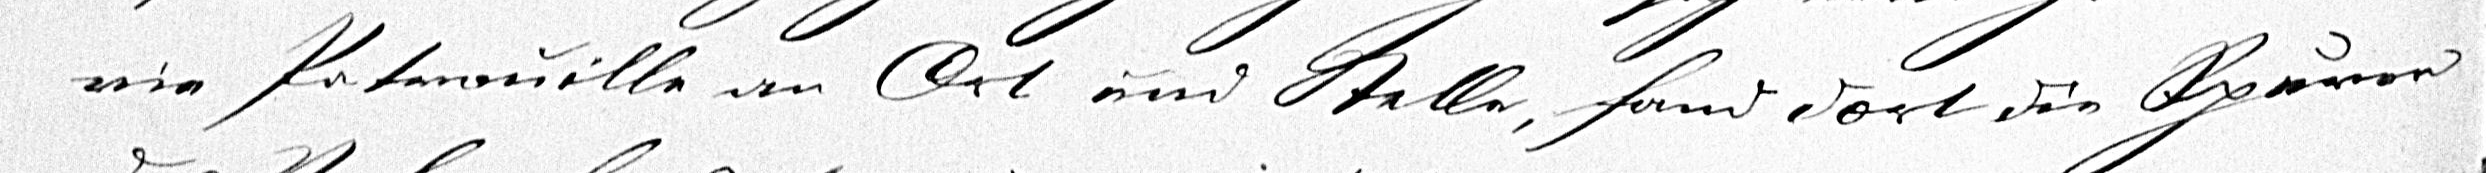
rie Patrouille an Ort und Stelle, fand Dort die Spuren
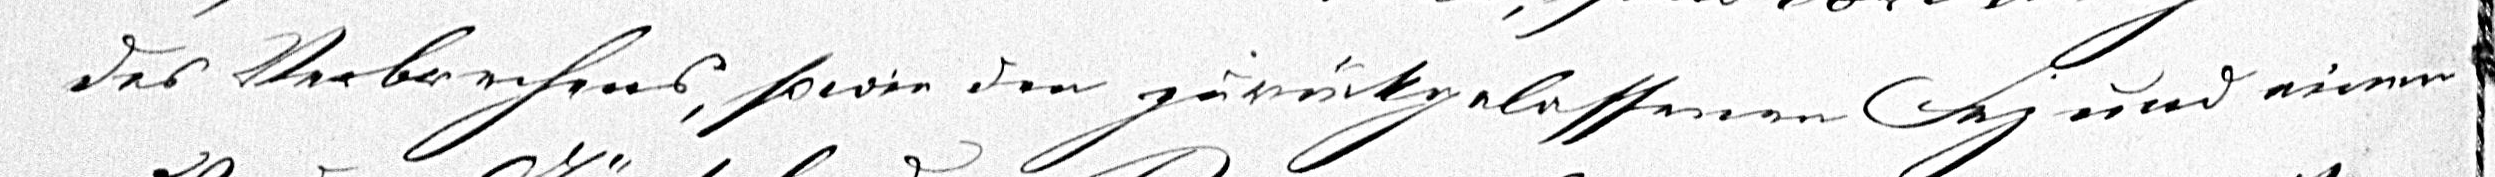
des Verbrechens, sowie den zurückgelassenen Fez und einen
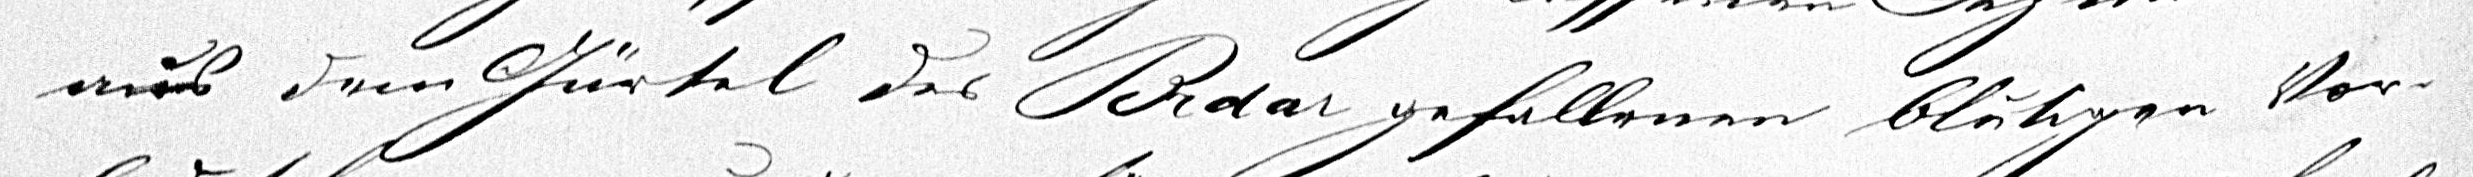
aus dem Gürtel des Brdar gefallenen blutigen Vor¬
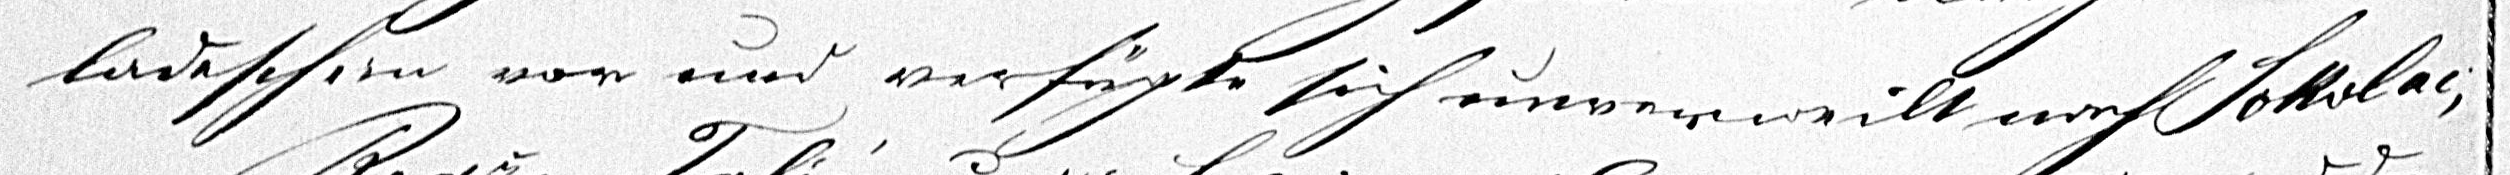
ladschein vor und verfügte sich unverweilt nach Sokolac,
